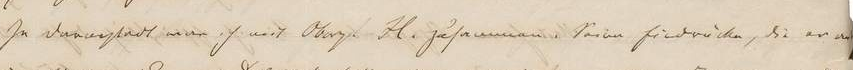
In Darmstadt war ich mit Oberst H. zusammen. Seine Eindrücke, die er aus
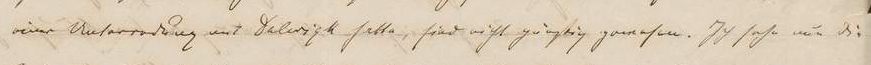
einer Unterredung mit Delbrück hatte, sind nicht günstig gewesen. Ich sehe nun die
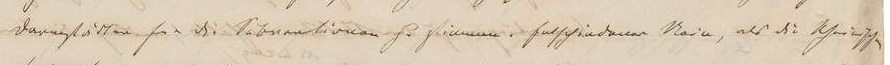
Darmstädter für die Subventionen zu stimmen. Entschiedener Nein, als die Rheinischen
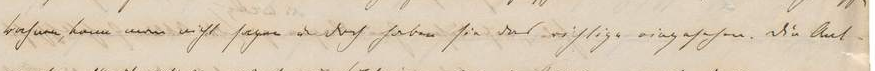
Bahnen, kann man nicht sagen u doch haben sie das richtige eingesehen. Die Ant-
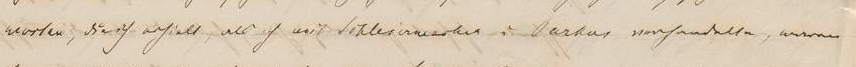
worten, die ich erhielt, als ich mit Schleiermacher u Parkus verhandelte, waren
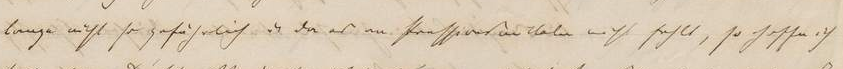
lange nicht so gefährlich u. da es an Pressionsmitteln nicht fehlt, so hoffe ich
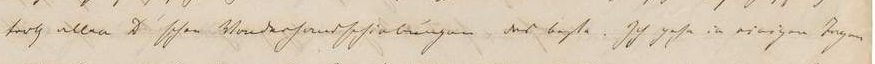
trotz allen D'schen Vonderhandschiebungen das Beste. Ich gehe in einigen Tagen
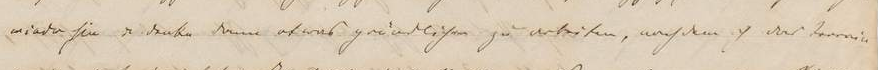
wieder hin u denke dann etwas gründlicher zu arbeiten, nachdem ich das Terrain
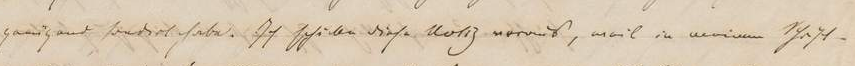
genügend sondirt habe. Ich schicke diese Notiz voraus, weil in meinem Schrift-
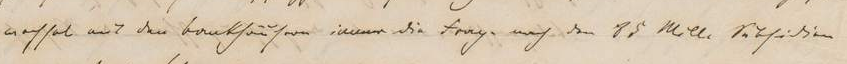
wechsel mit den Bankhäusern immer die Frage nach den 85 Mill. Subsidien
